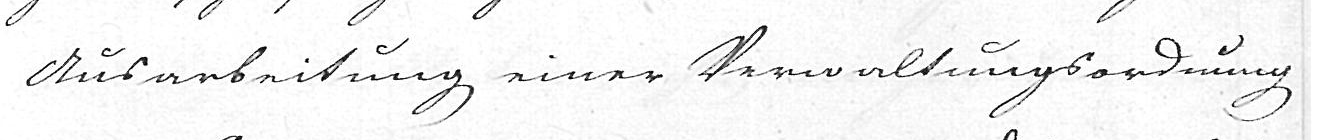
Ausarbeitung einer Verwaltungsordnung
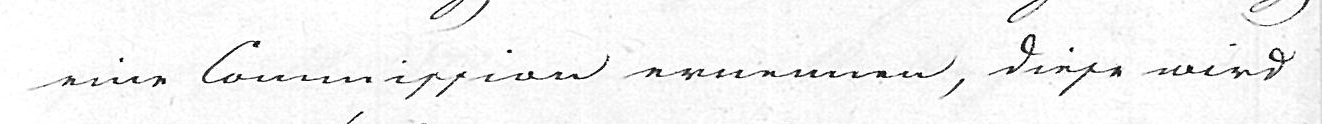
eine Commission ernennen, diese wird
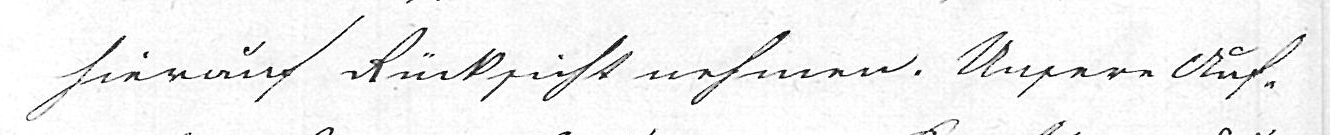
hierauf Rücksicht nehmen. Unsere Auf-
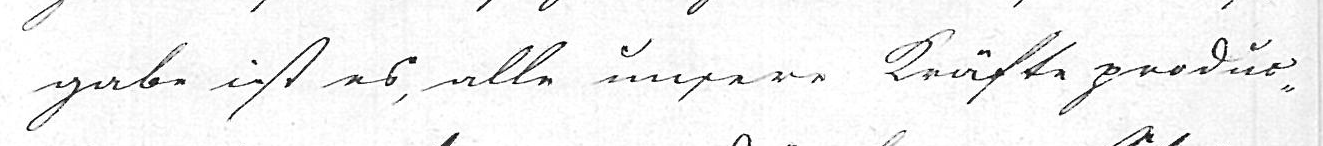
gabe ist es, alle unsere Kräfte produc-
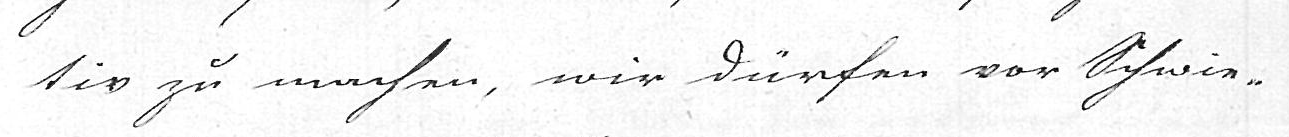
tiv zu machen, wir dürfen vor Schwie-
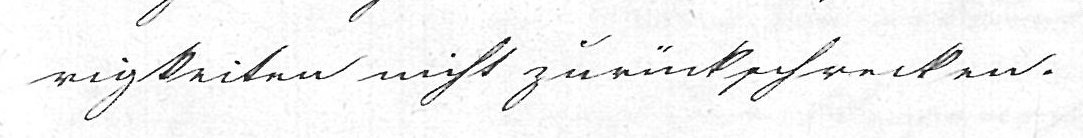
rigkeiten nicht zurckschrecken.
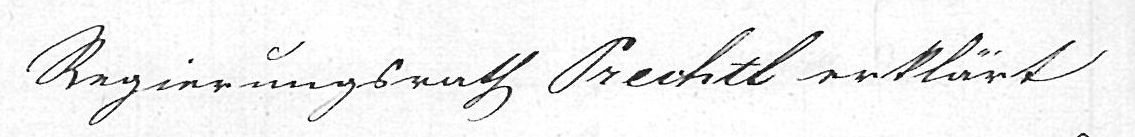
Regierungsrath Prechtl erklärt
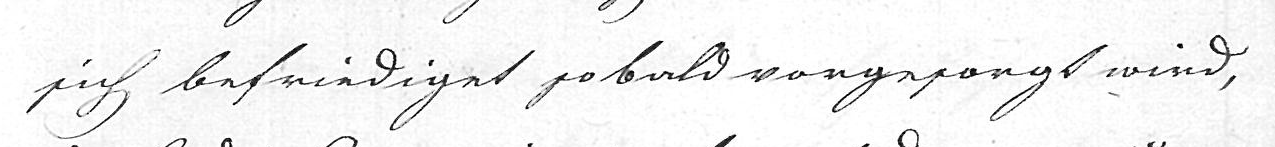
sich befriediget sobald vorgesorgt wird,
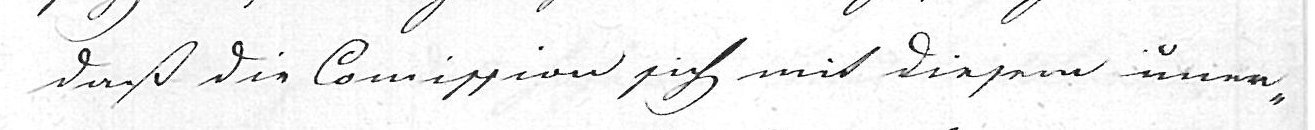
daß die Commission sich mit diesem uner-
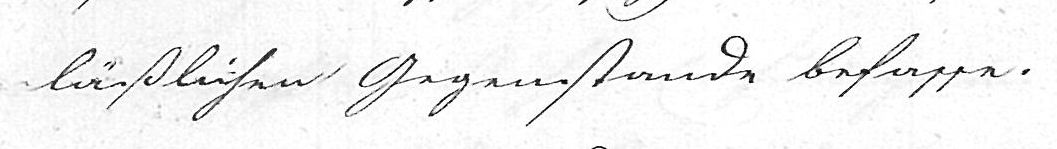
läßlichen Gegenstande befasse.
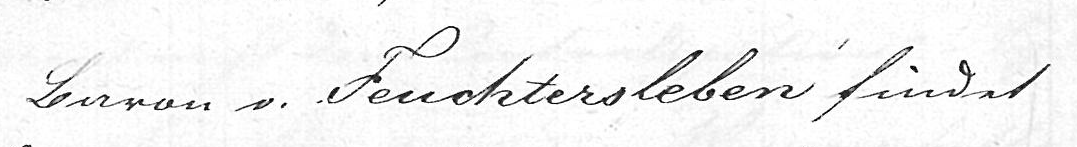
Baron v. Feuchtersleben findet
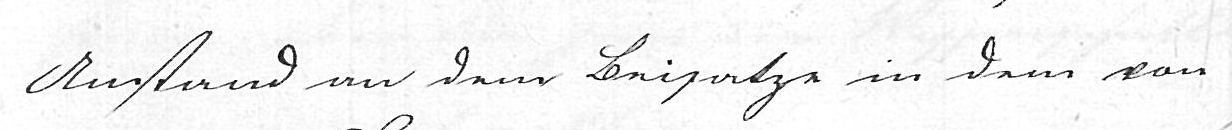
Anstand an dem Beisatze in dem von
